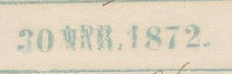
29 März 1872
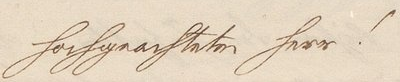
Hochgeachteter Herr!
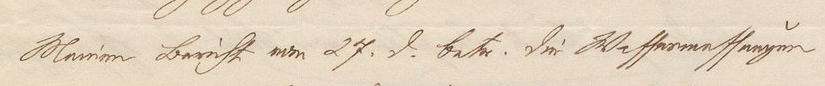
Meinen Bericht vom 27. d. betr. die Wassermessungen
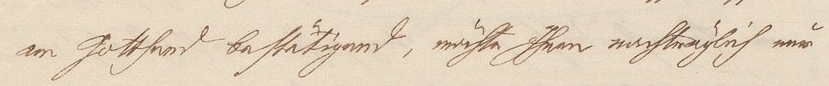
am Gotthard bestätigend, möchte Ihnen nachträglich nur
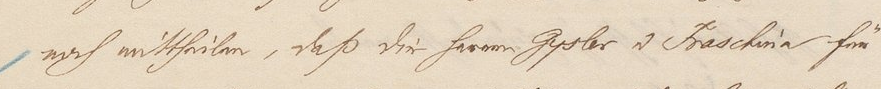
noch mittheilen, daß die HHerrn Gysler & Fraschina für
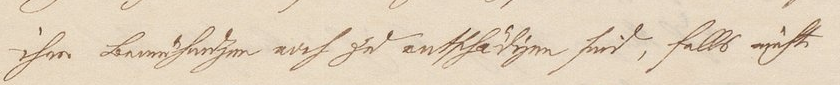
ihre Bemühungen noch zu entschädigen sind, falls nicht
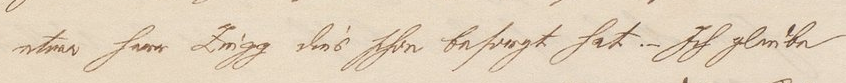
etwa Herr Zingg dies schon besorgt hat. – Ich glaube
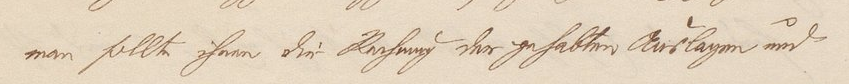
man sollte ihnen die Rechnung der gehabten Auslagen und
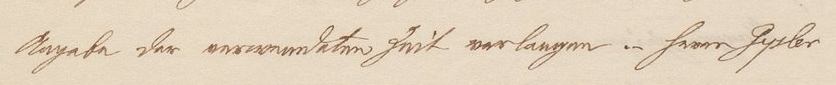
Angabe der verwendeten Zeit verlangen. – Herr Gysler
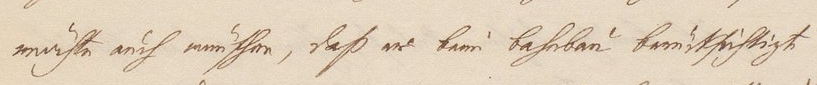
möchte auch wünschen, daß er beim Bahnbau berücksichtigt
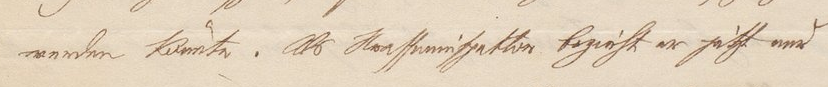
werden könnte. Als Wasserinspektor bezieht er jetzt nur
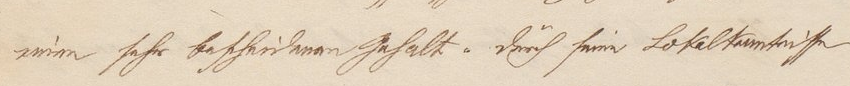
einen sehr bescheidenen Gehalt. Durch seine Lokalkenntnisse
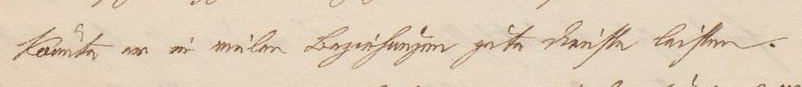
könnte er in vielen Beziehungen gute Dienste leisten.
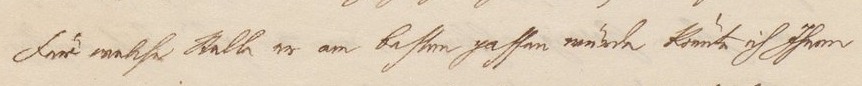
Für welche Stelle er am besten passen würde könnte ich Ihnen
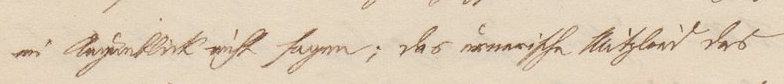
im Augenblick nicht sagen; das numerische Mitglied des
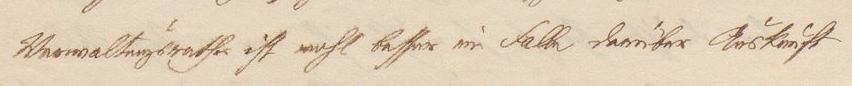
Verwaltungsrathes ist wohl besser im Falle darüber Auskunft
